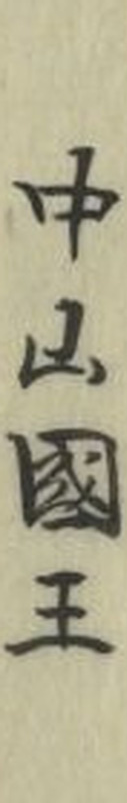中山国王
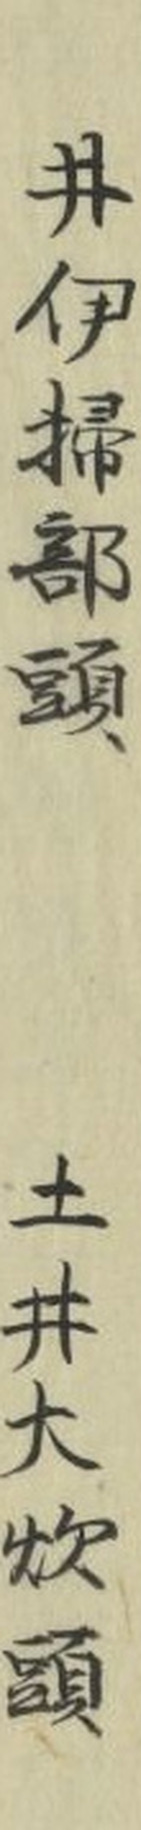井伊掃部頭土井大炊頭
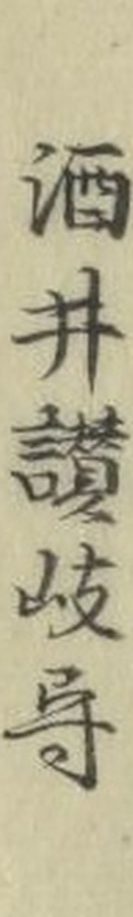酒井日向守
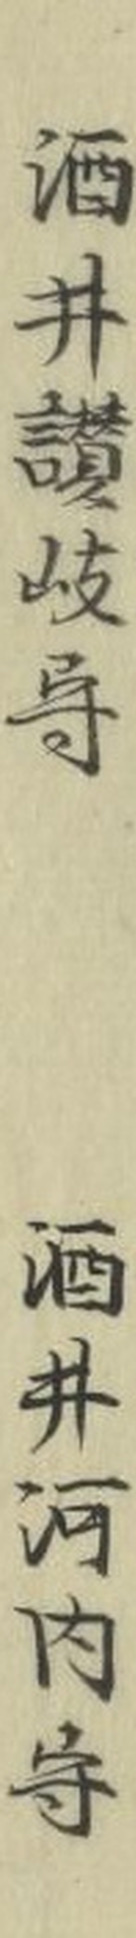酒井讃岐守酒井河内守
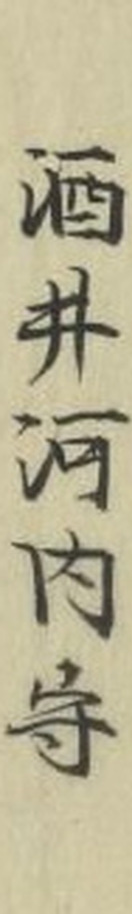酒井日向守
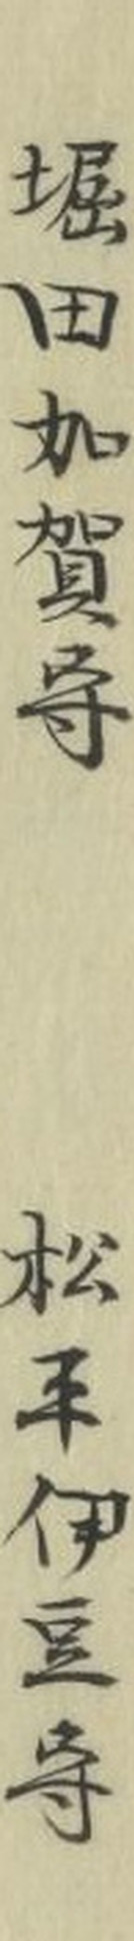堀田加賀守松平伊豆守
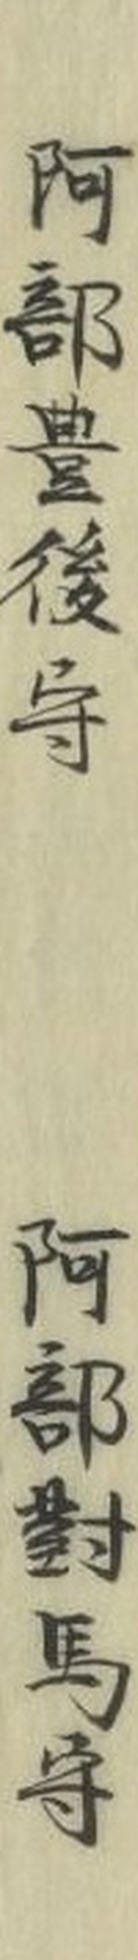阿部豊後守阿部對馬守
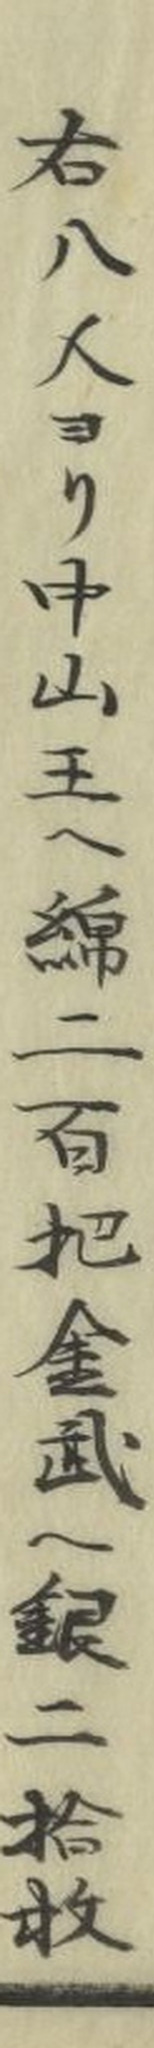右八人ヨリ中山王へ綿二百把金武へ銀二拾枚
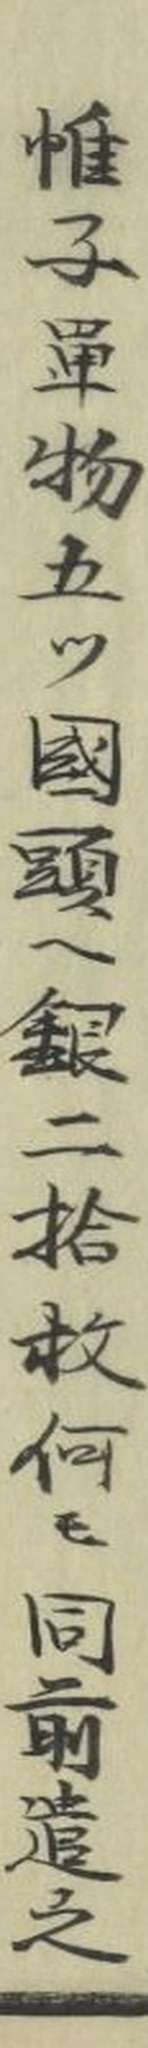帷子単物五ッ国頭へ銀二拾枚何モ同前遣之
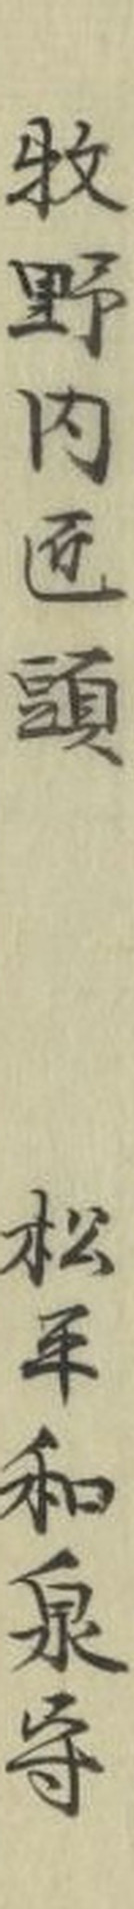牧野内匠頭松平和泉守
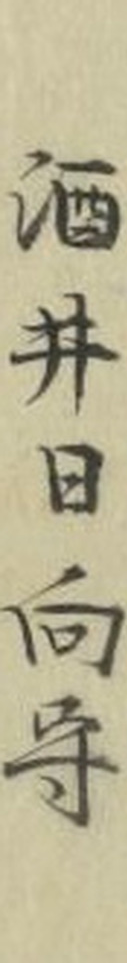酒井日向守
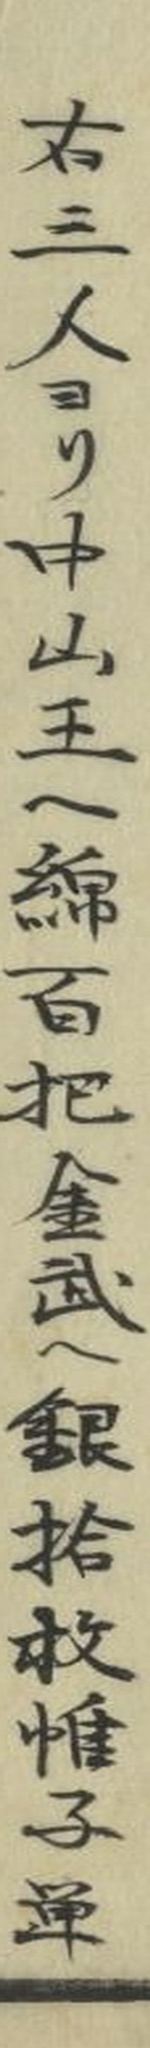右三人ヨリ中山王へ綿百把金武へ銀拾枚帷子単

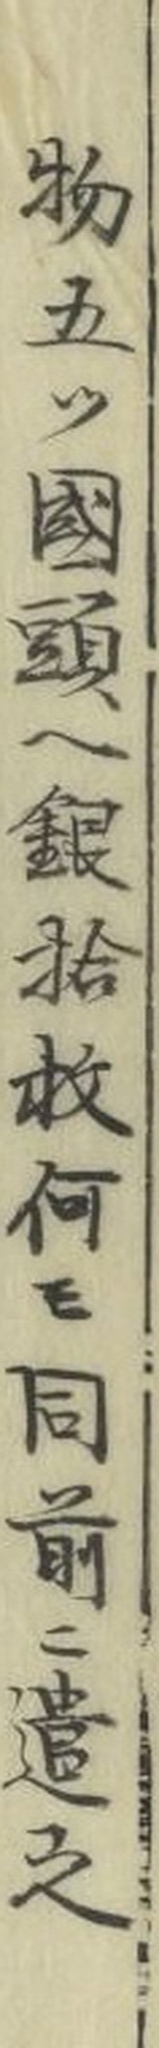物五ッ国頭へ銀拾枚何モ同前ニ遣之
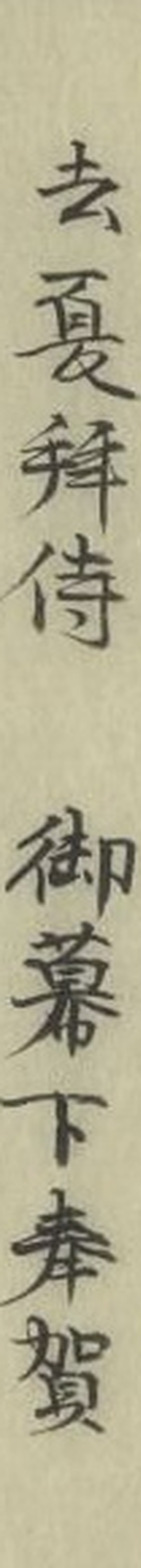去夏拝侍御幕下奉賀
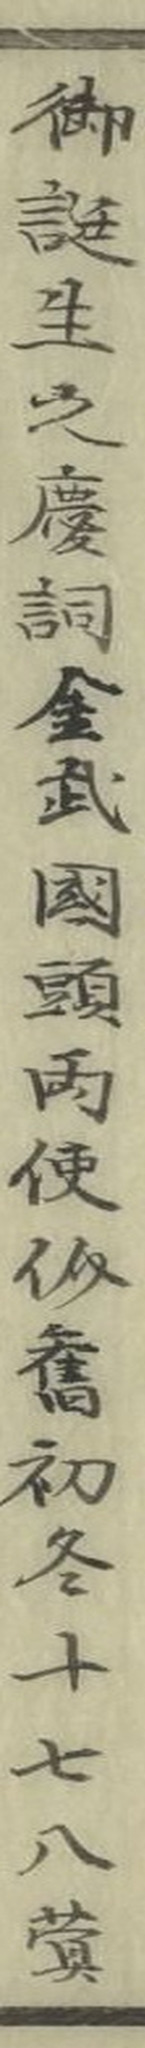御誕生之慶詞金武国頭両使仍旧初冬十七八蓂
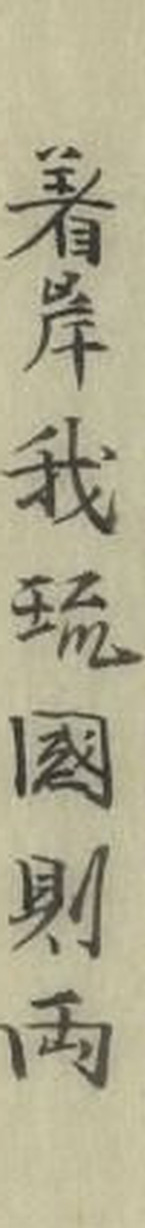着岸我琉国則両
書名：琉球往来（上）
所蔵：University of the Ryukyus Library
